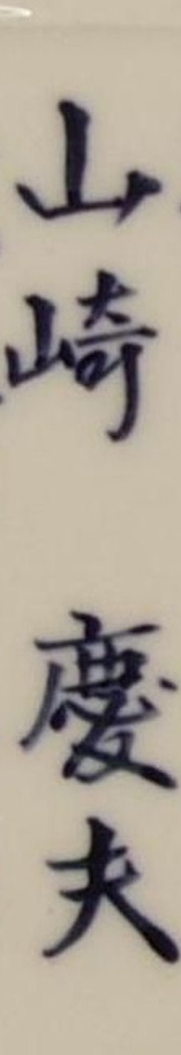山崎慶夫
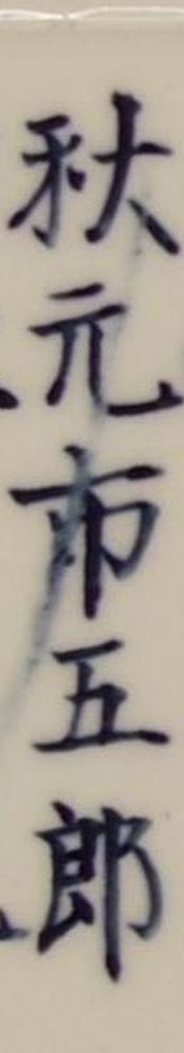秋元市五郎
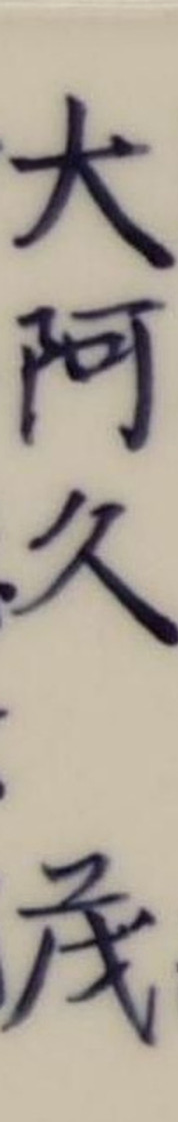大阿久茂
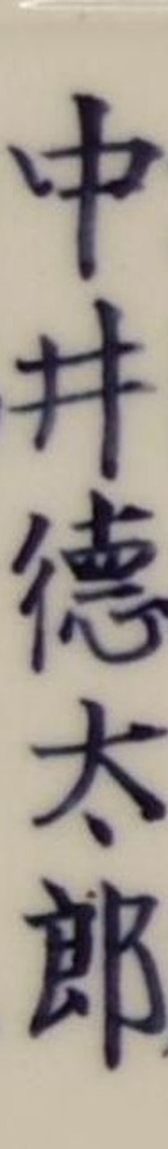中井徳太郎
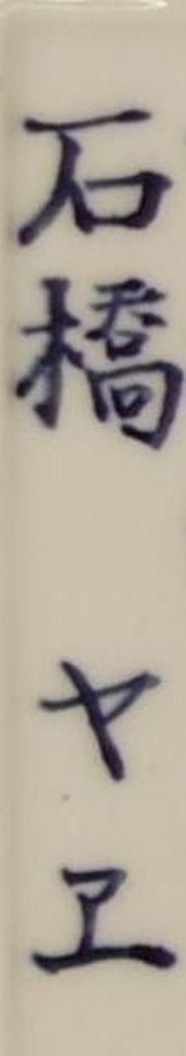石橋ヤエ

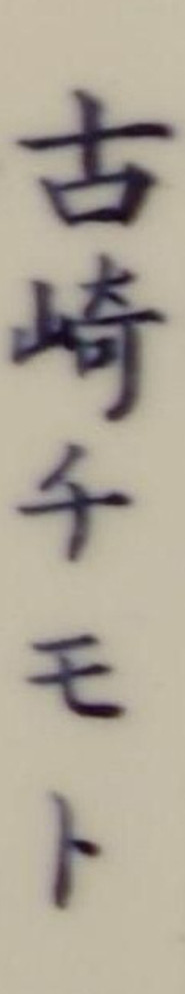古崎チモト
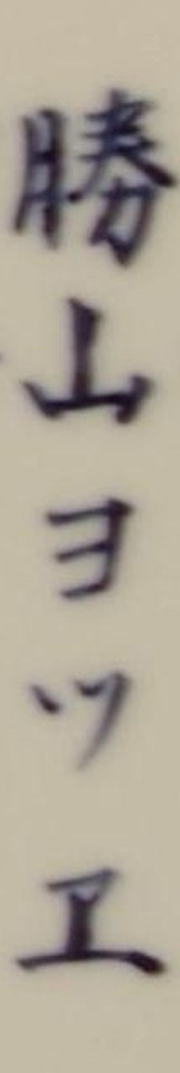勝山ヨツエ
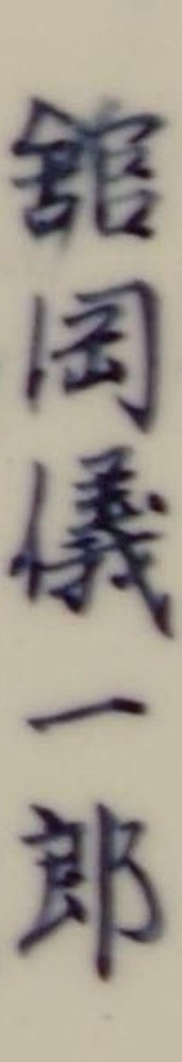舘岡儀一郎
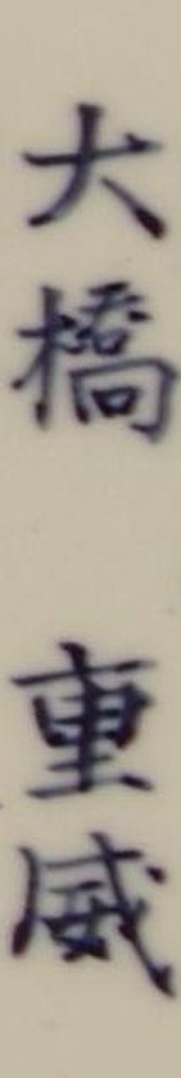大橋重盛
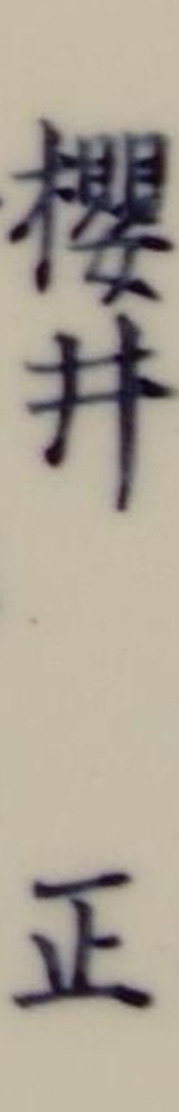桜井正
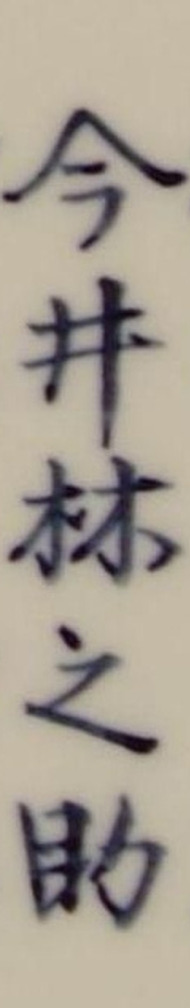今井林之助
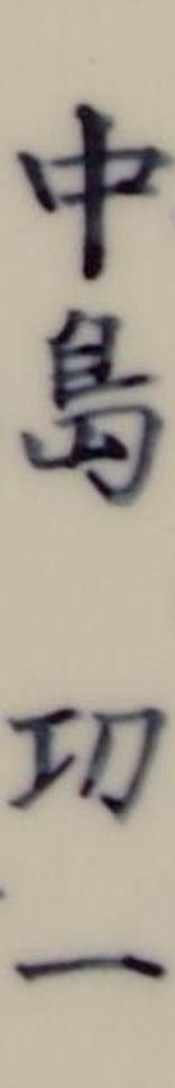中島功一
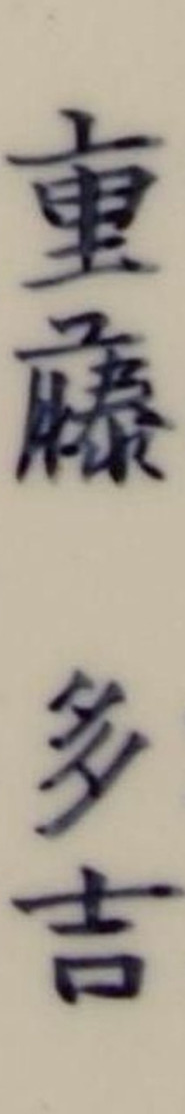重藤多吉
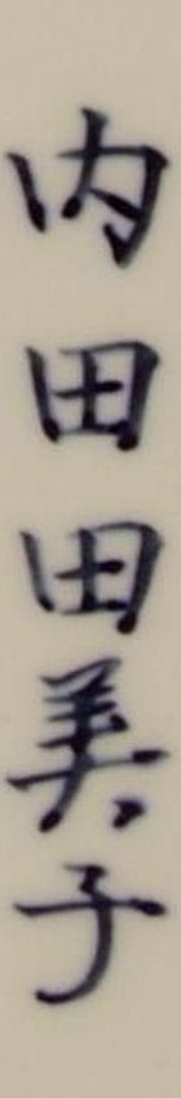内田田美子
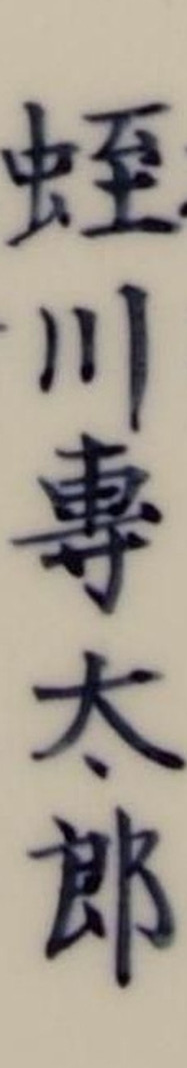蛭川専太郎
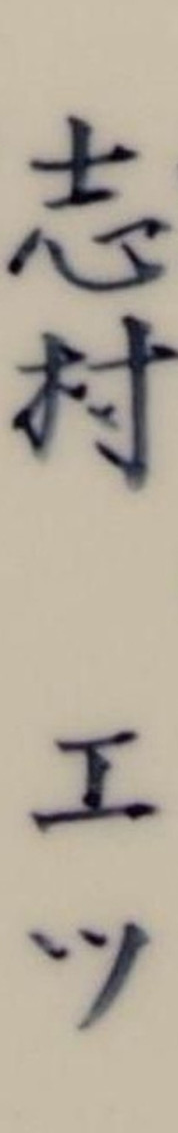志村エツ
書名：E~L
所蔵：高野山金剛峯寺
